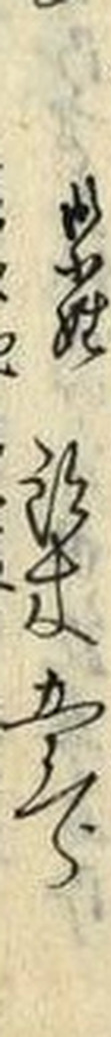御小姓鈴木五三郎
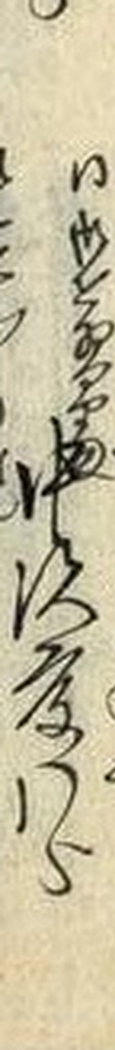同御近習番中沢藤八郎
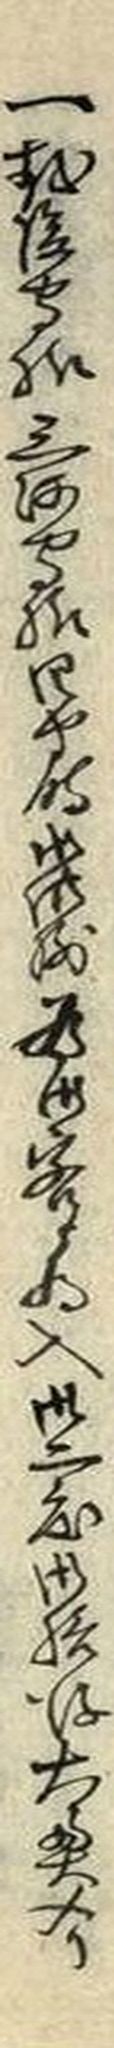一越後守様三河守様四半時御供揃為御客被為入御二度御膳後大奥入り
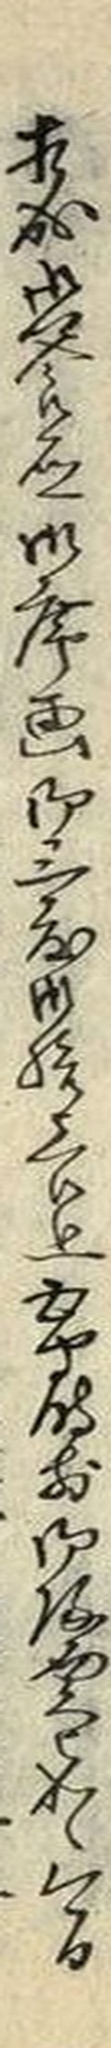相成御饗応御席画御三度御膳被召上五半時前御帰殿被成候今日
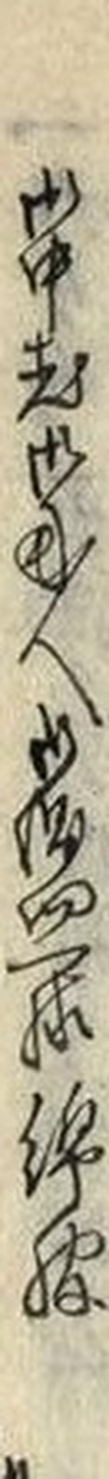御中老御用人御側向一統綿服
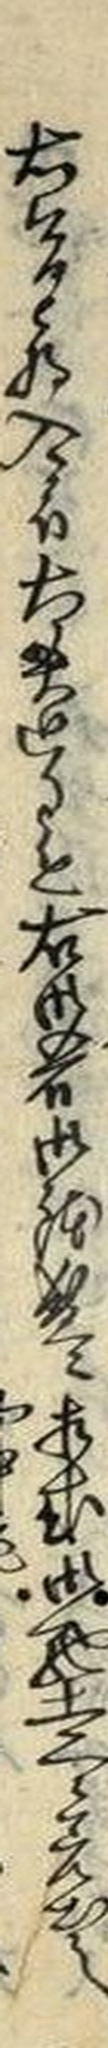右今日被為入候ニ付大奥廻り被進右御肴御鉢盛ニ相成御馳走ニ差出之

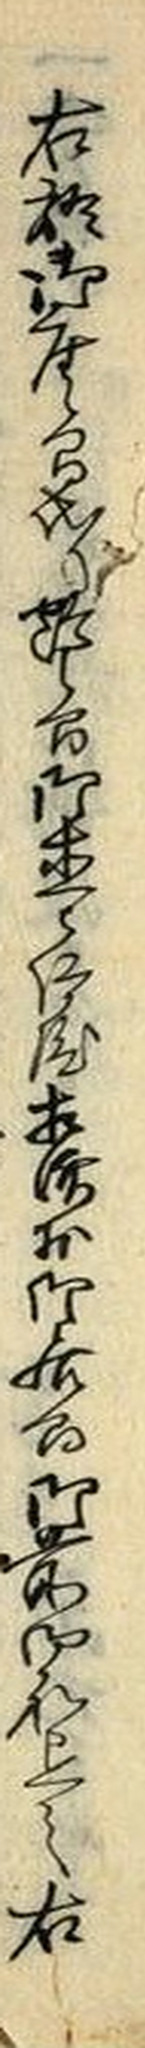右於御座之間代り鶴之間御直被仰渡相済於御居間御前御礼申上之右
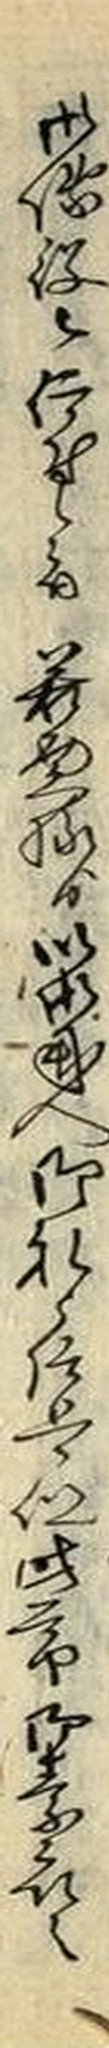御傅役被仰付候ニ付若殿様ゟ以御用人御礼被仰上候但此節御素衣之
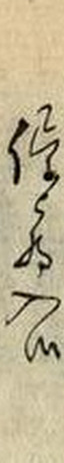侭被為入候
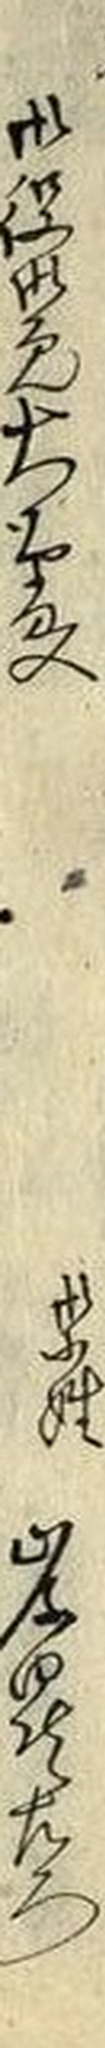御役御免大御番入御小姓岸田次郎左衛門
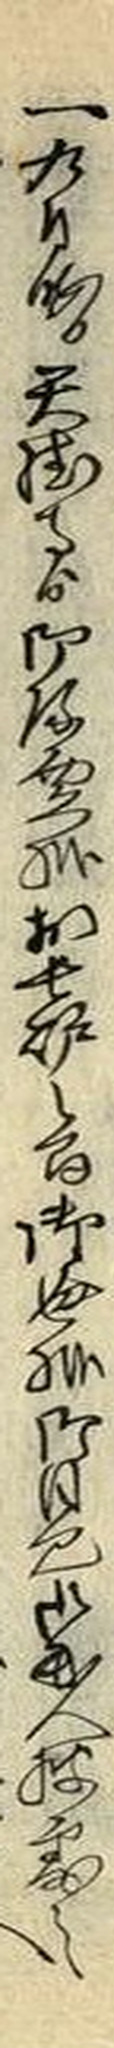一九月晦日天徳寺ゟ御帰殿掛於長炉之間御通掛御目見御用人披露之
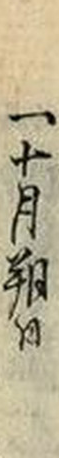一十月朔日
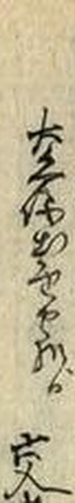大久保出雲守様ゟ
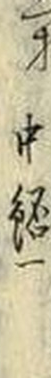中鯔一
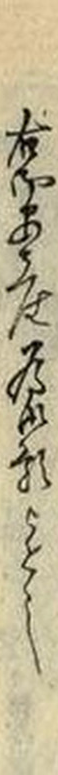右御安産為御歓被進之
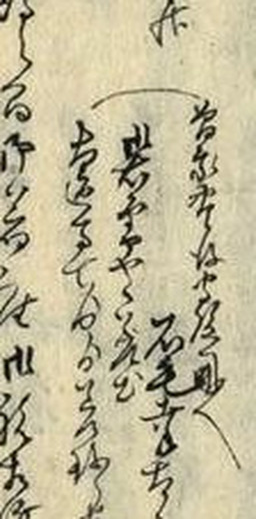御右筆部やへ差出
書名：少傅日録抄（斉承付側向頭取日記、在府）
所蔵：福井県文書館 Fukui Prefectural Archives
